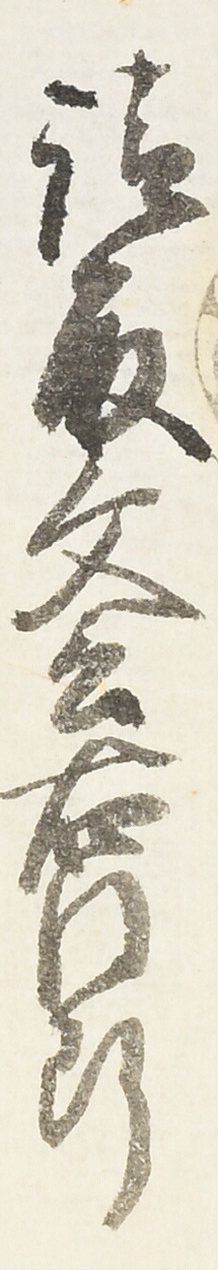請取文言右同断
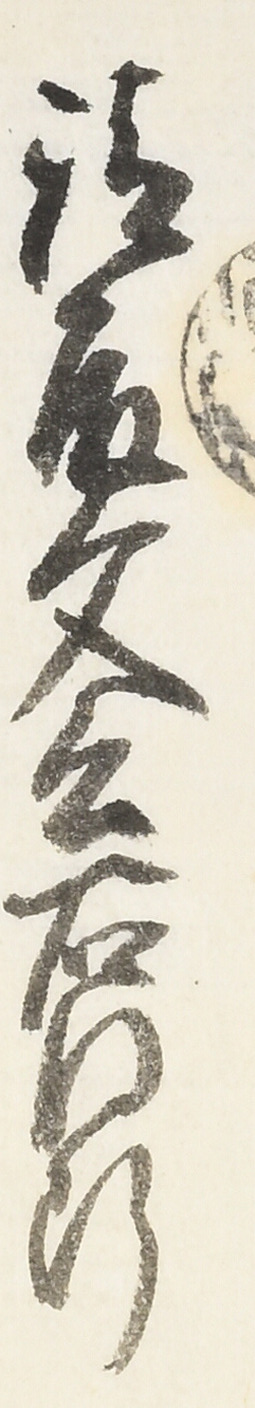請取文言右同断

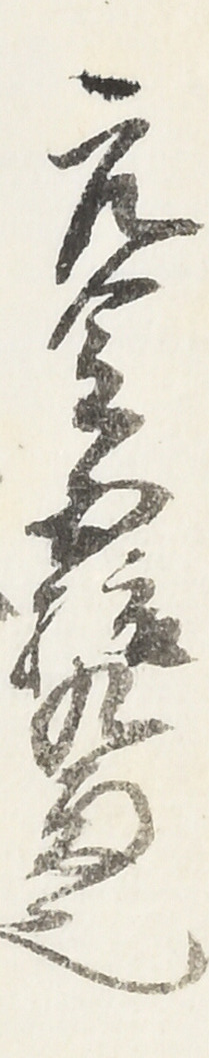元金五拾九両也
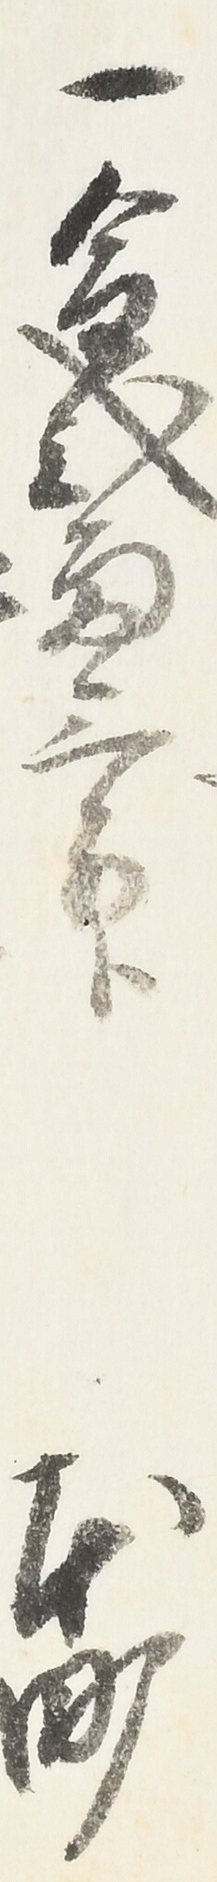一金弐両三分ト本町
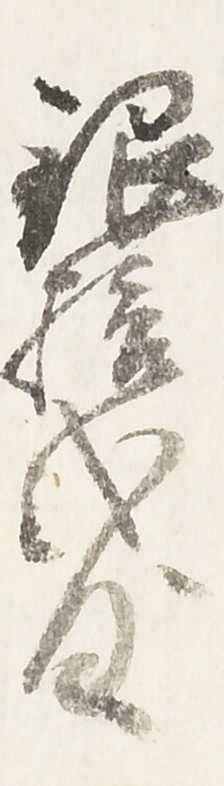銀拾弐匁
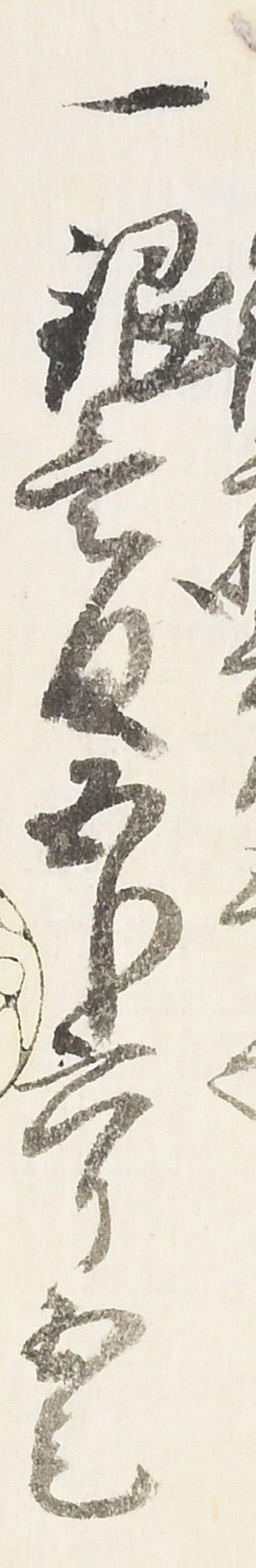一銀壱匁五分六厘五毛
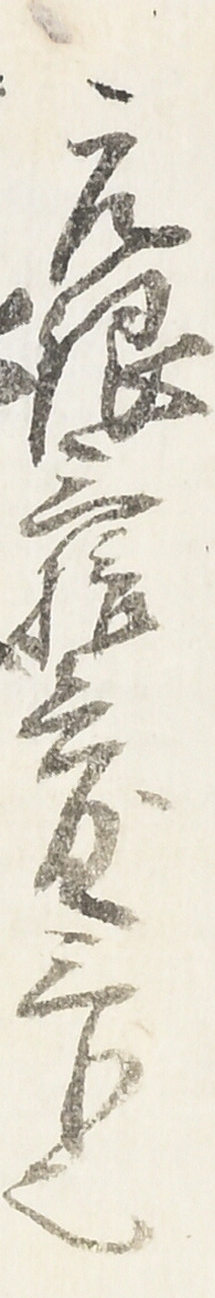元銀三拾壱匁三分也
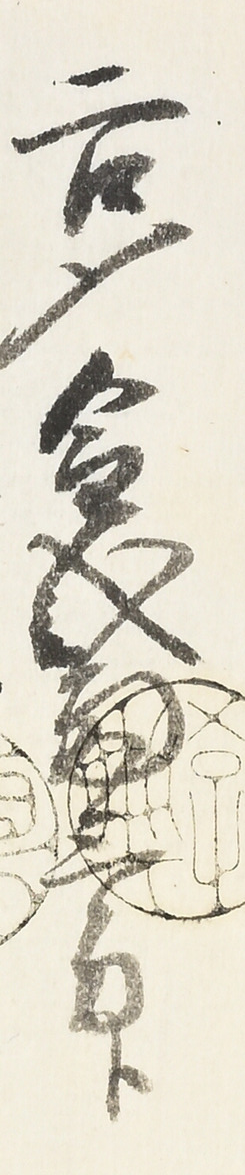二口〆金弐両三分ト
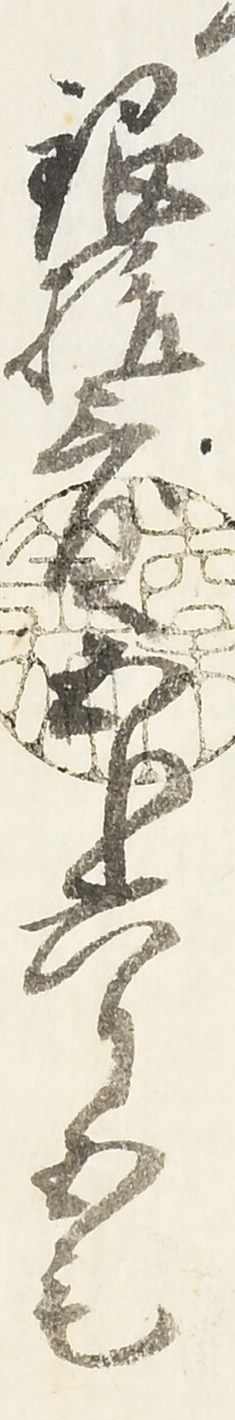銀拾三匁五分六厘五毛
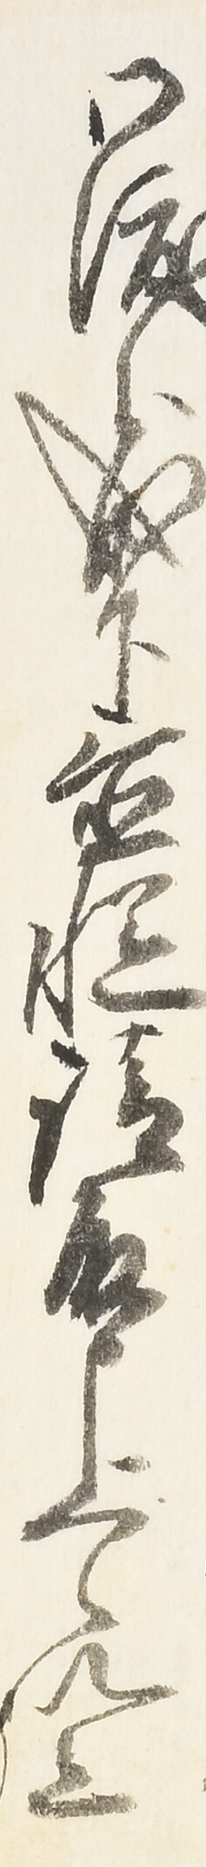御渡被成下置慥請取申上候以上
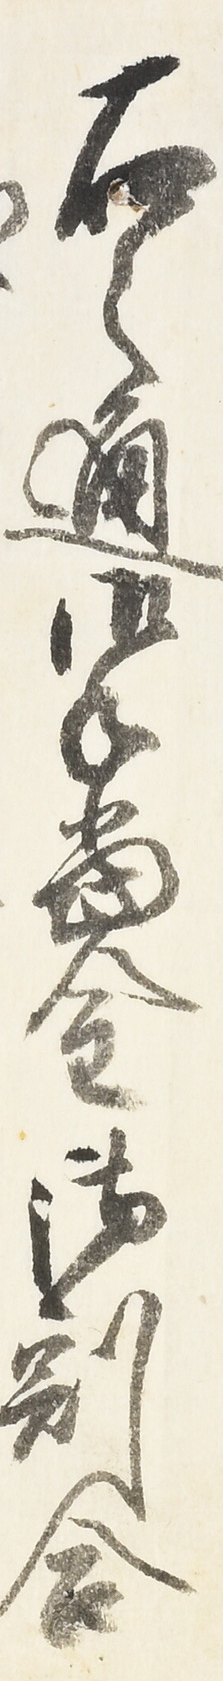右之通御手当金御割合
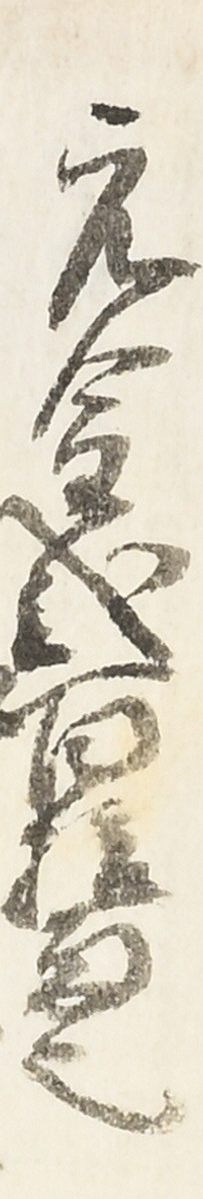元金弐百拾両也
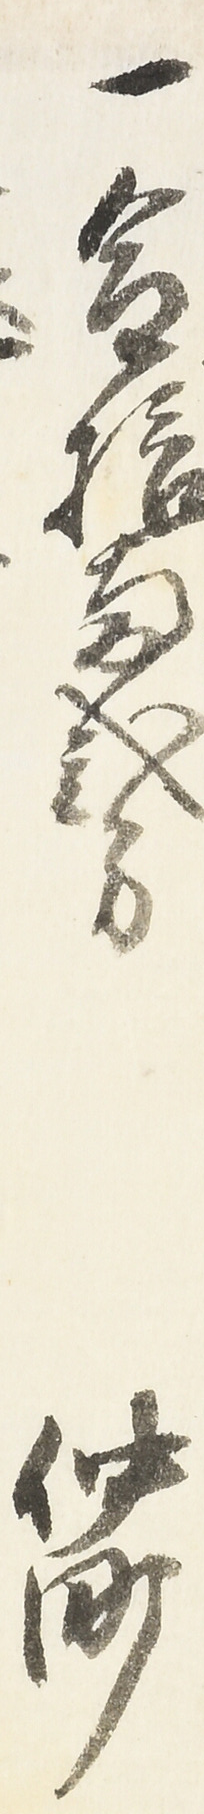一金拾両弐分仲町
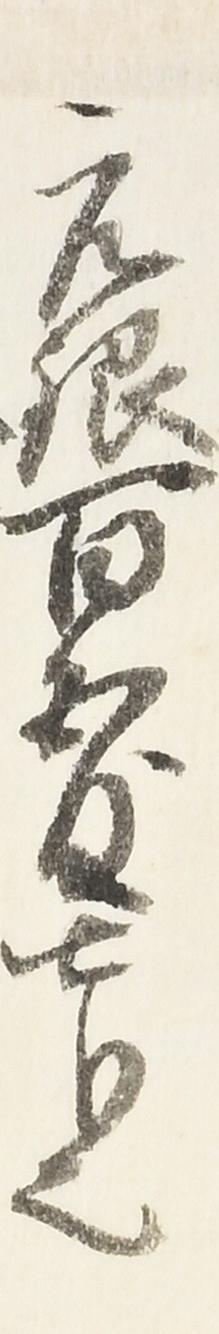元銀百五匁七分也
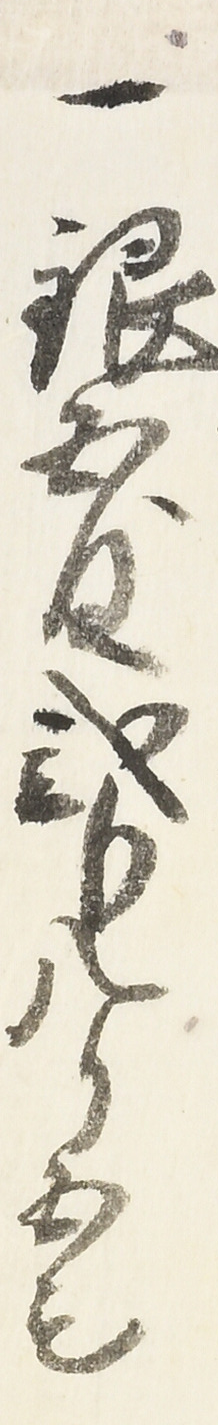一銀五匁弐分八厘五毛
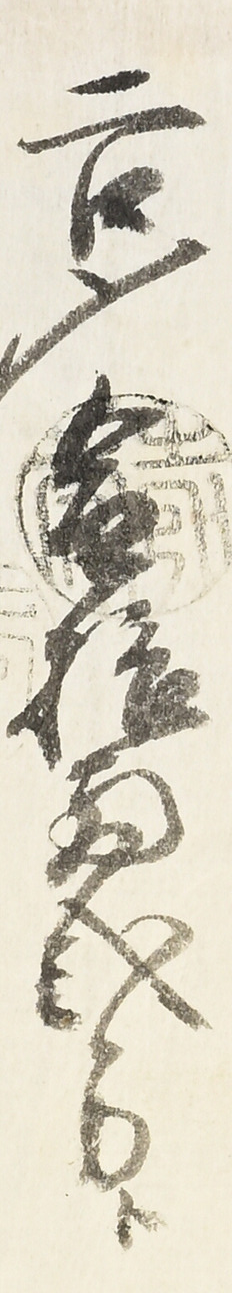二口〆金拾両弐分ト
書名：御才覚金御利足割渡扣帳
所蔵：伊那市立高遠町図書館・合同会社AMANE
